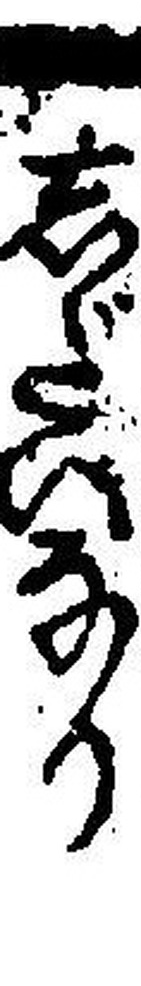しだいなり
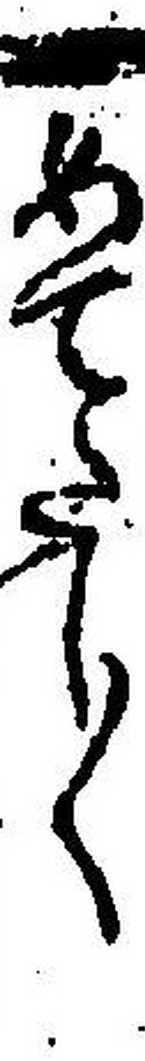めてたし〳〵
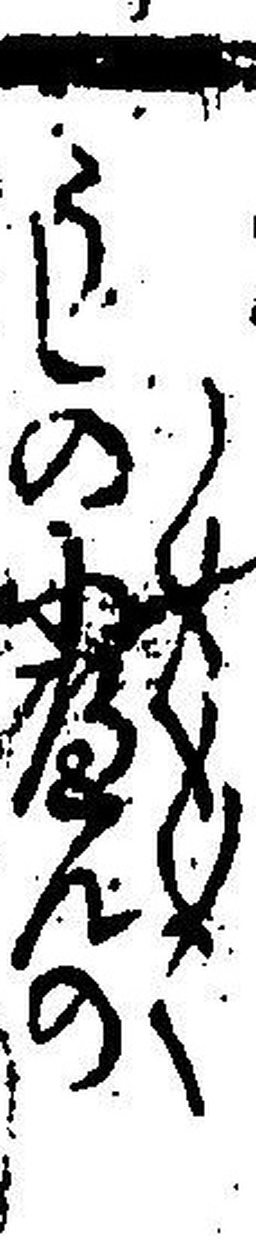うしのにへんの
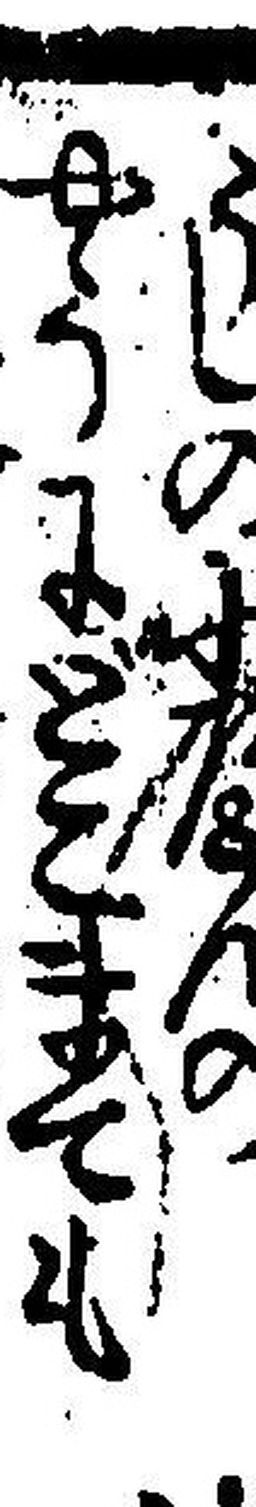やうにどこまても

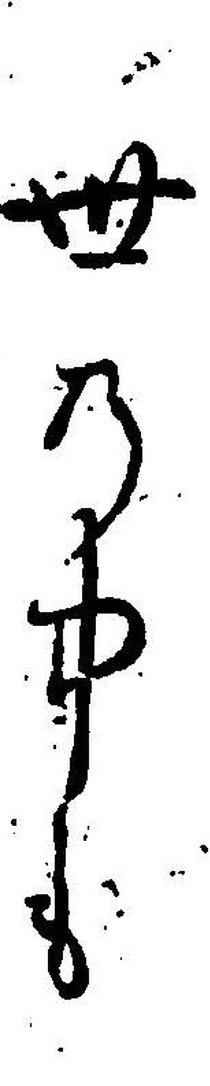世の中も
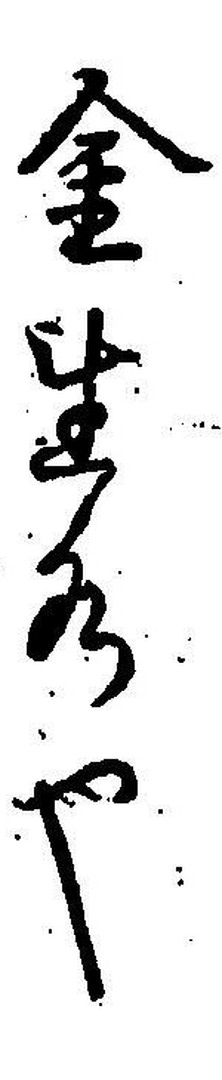金生水や
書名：徳若水縁起金性 / 樹下石上作
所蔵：東京大学総合図書館 General Library in the University of Tokyo, JAPAN
